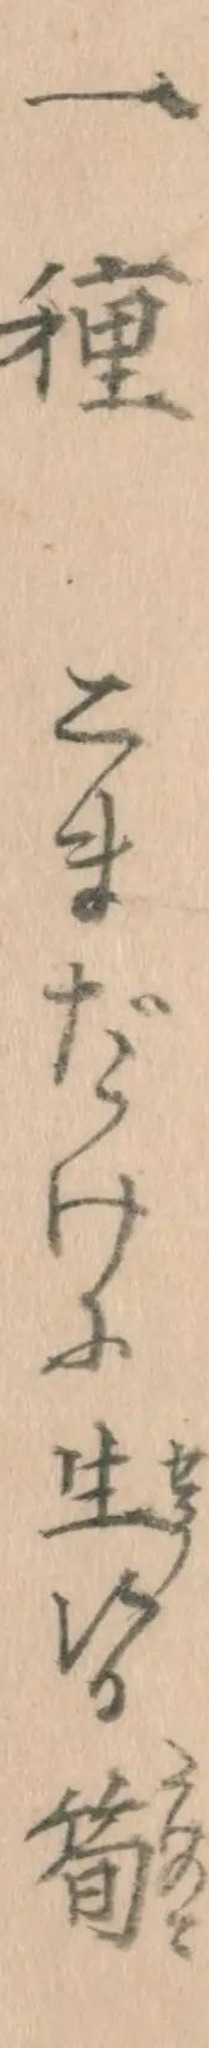一種こまだけに生する筍

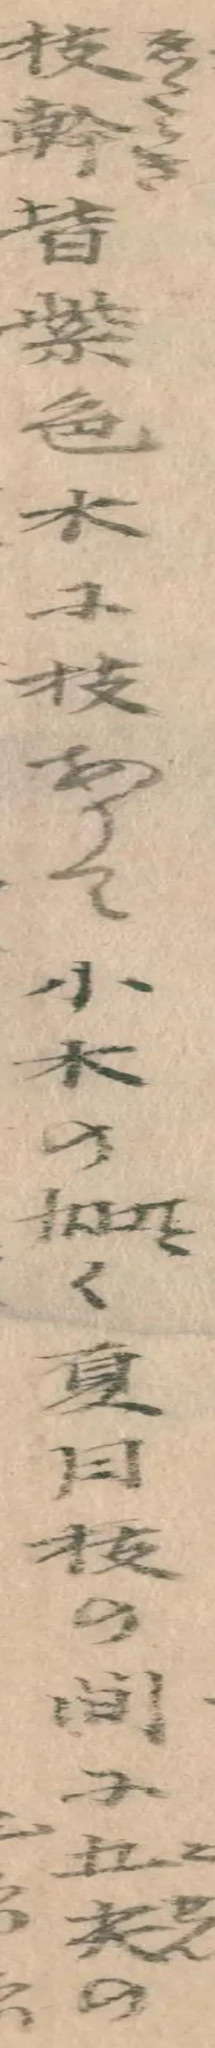枝幹皆紫色木に枝ありて小木の如く夏月枝の間に五尖の
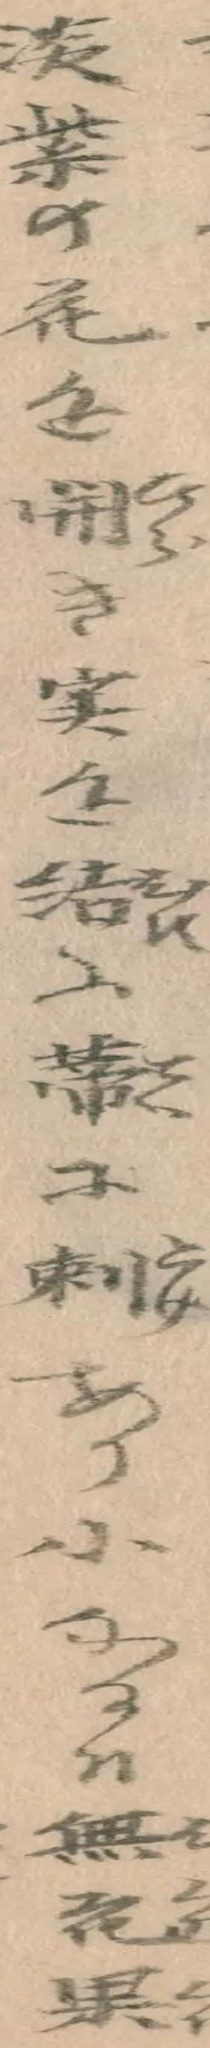淡紫の花を開き実を結ふ蒂に剌あり小なるは無花果
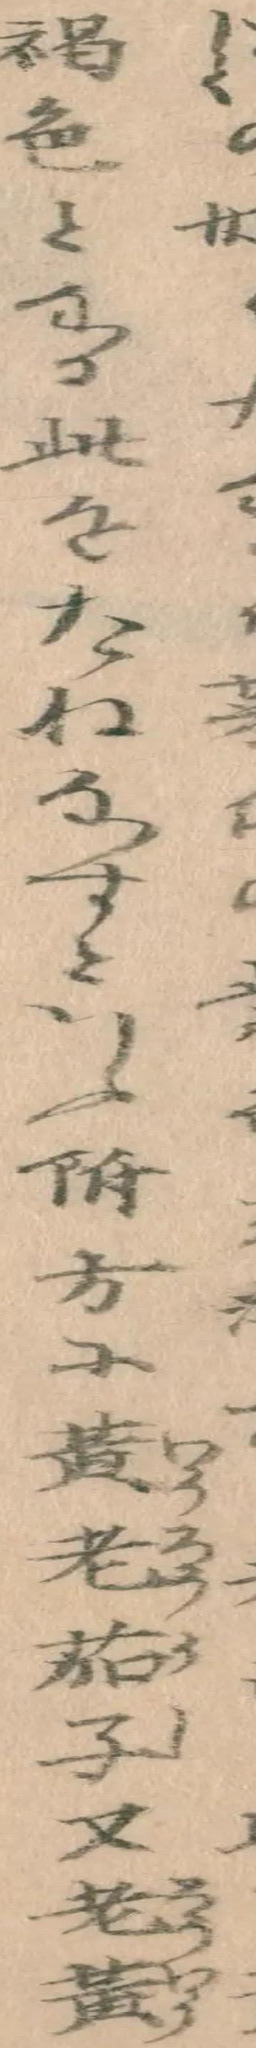褐色となる此をたねなすといふ附方に黄老茄子又老黄
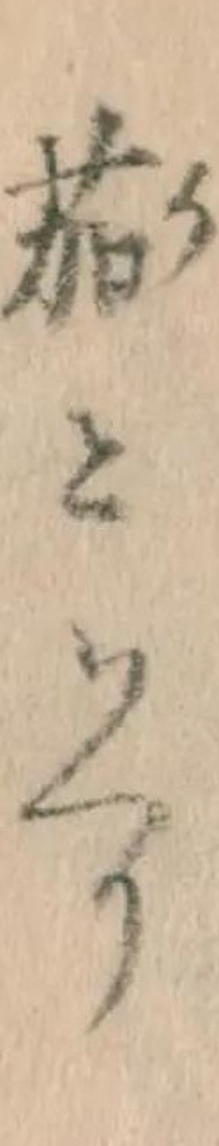茄といへり

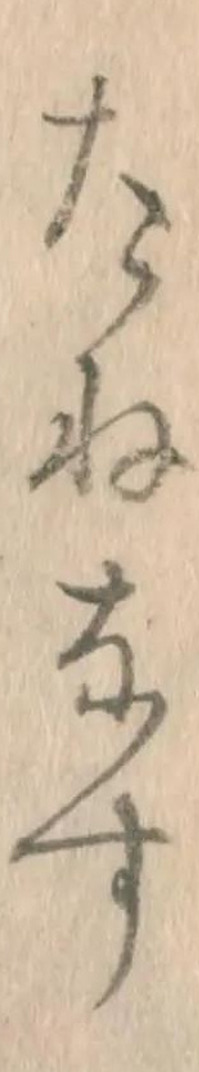たねなす
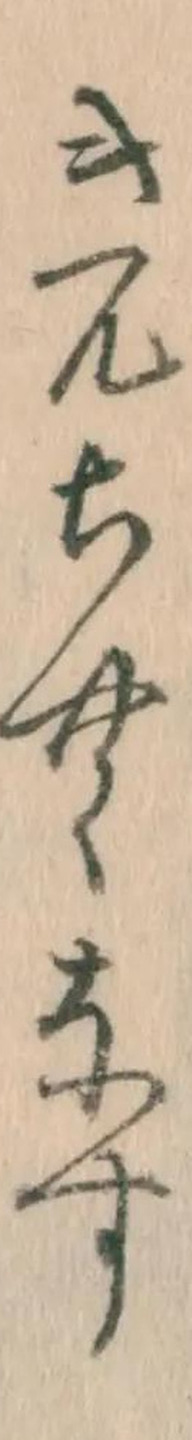きんちやくなす
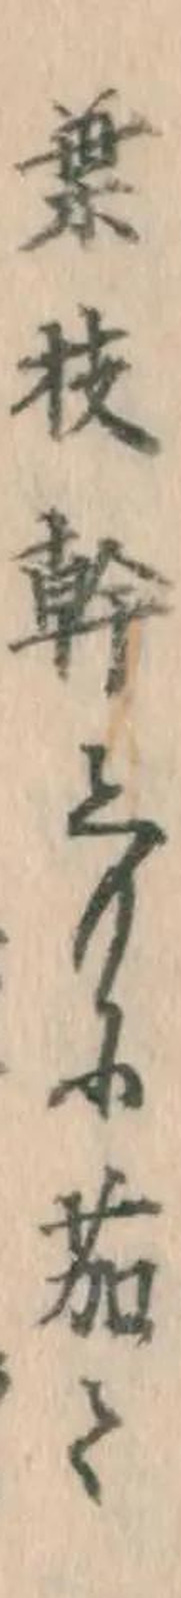葉枝幹ともに茄と
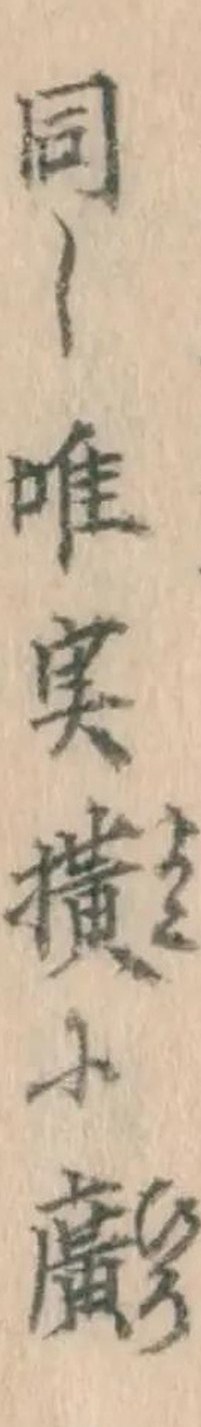同し唯実横に広
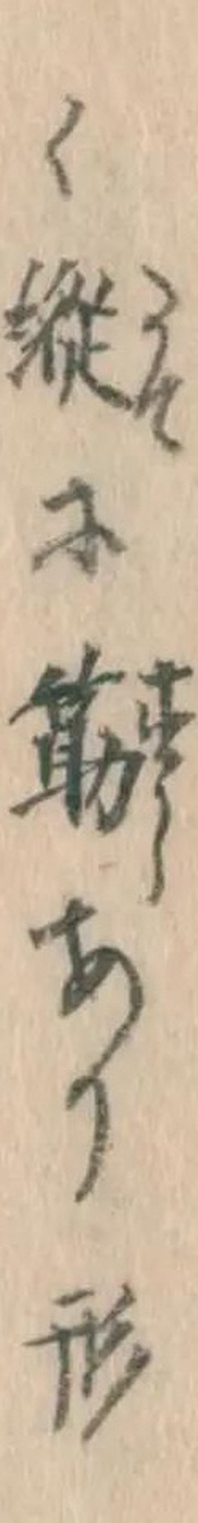く縦に筯あり形
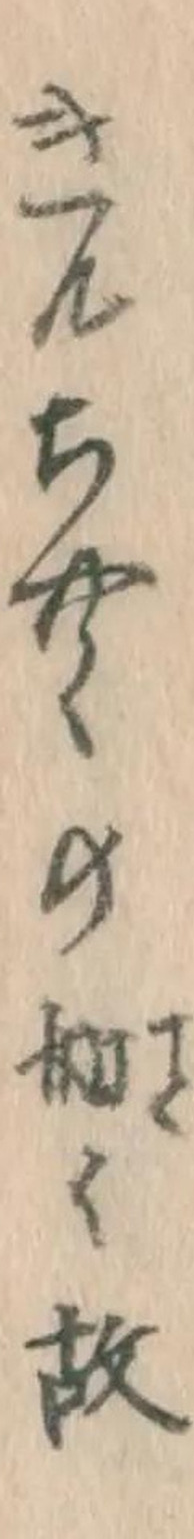きんちやくの如く故
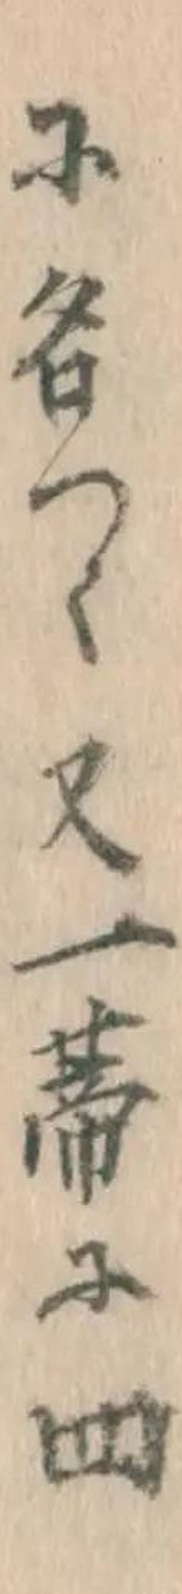に名つく又一蒂に四
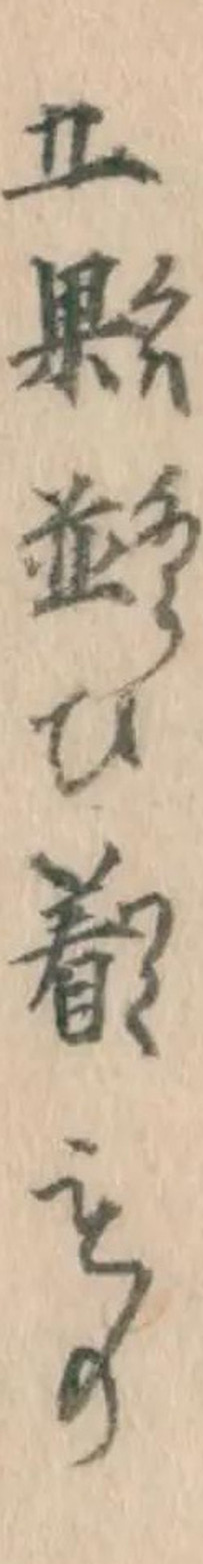五果並ひ着もの
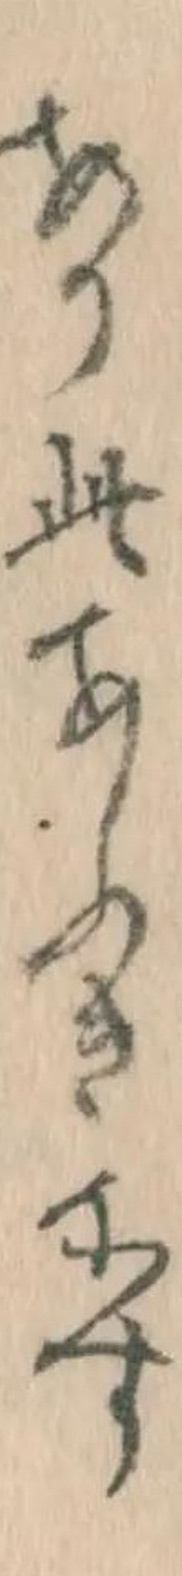あり此あふきなす
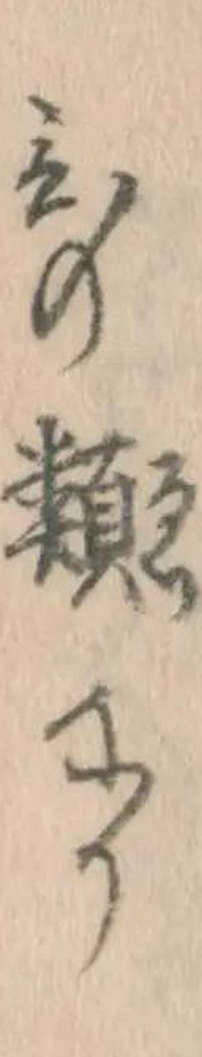ひの類なり

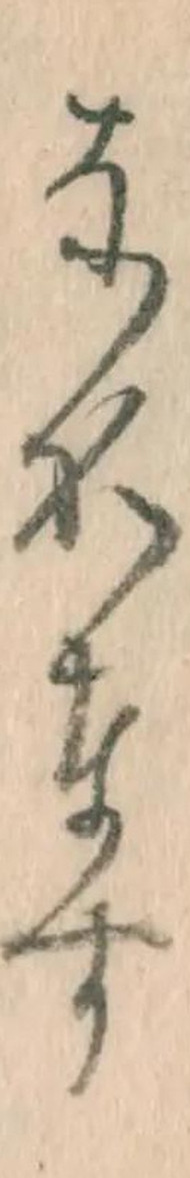なかなす
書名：本草図譜. 巻52-54
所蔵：国立国会図書館 National Diet Library, JAPAN
